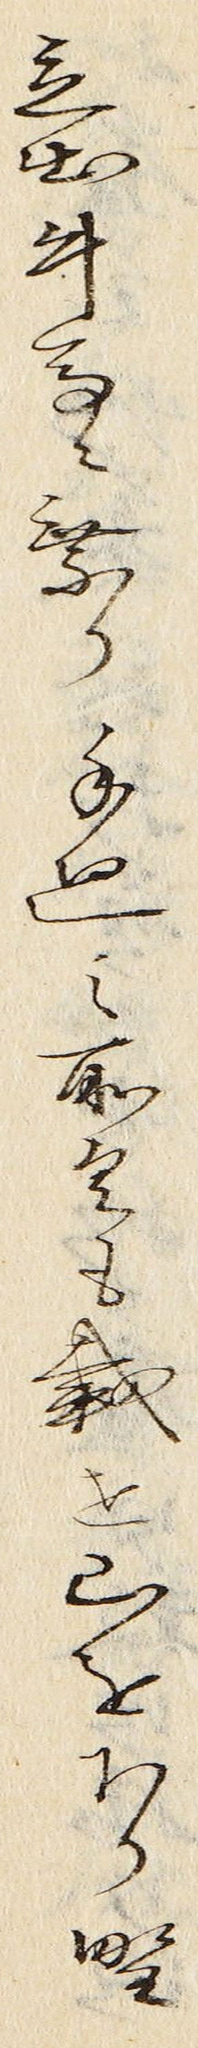立出牛馬に乗り手廻之所具も載せ山を下り野
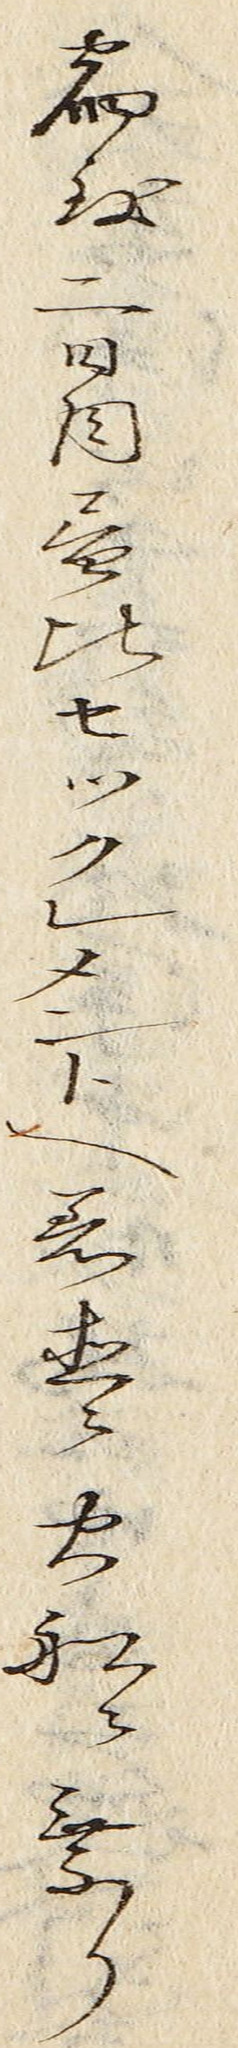宿致二日目昼比セツクレメントへ着直に員船に乗り
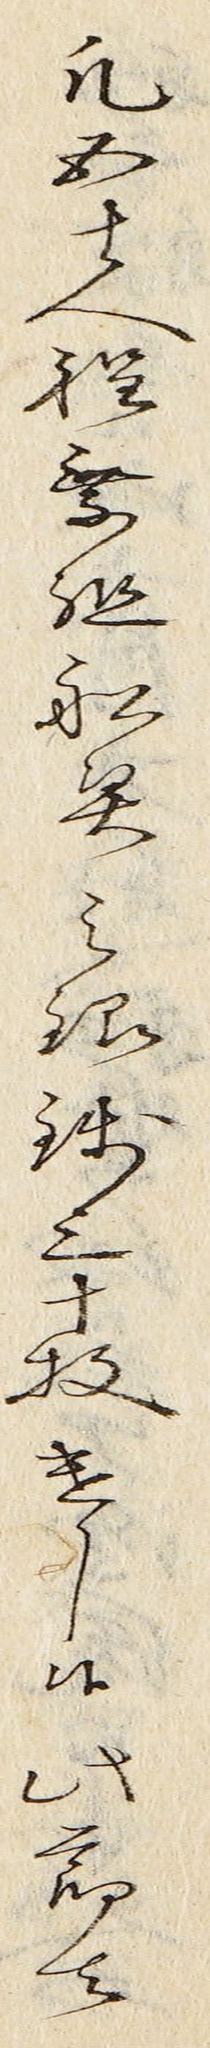凡五十人程乗組船具之銀銭三十枚遣し候此節は
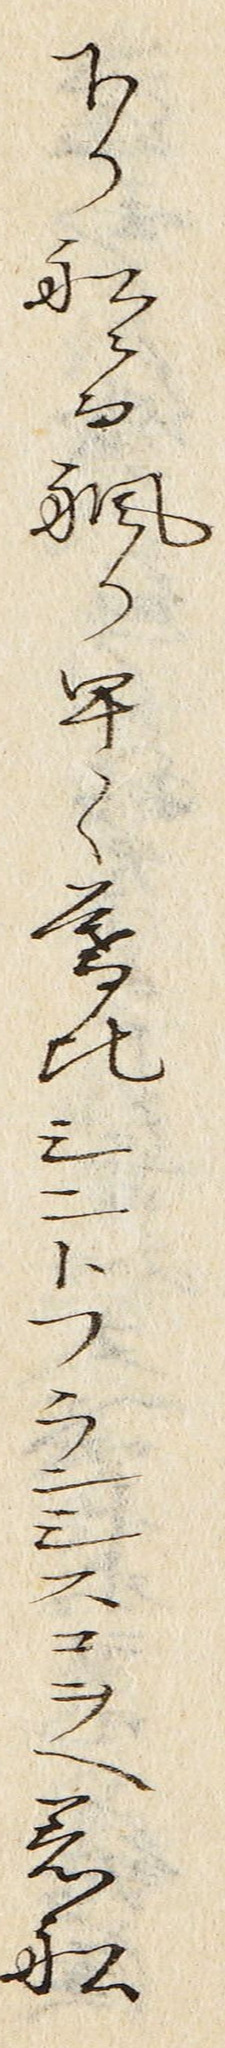下り船に而䑺り早々暮比シントフランシスコヲへ着船
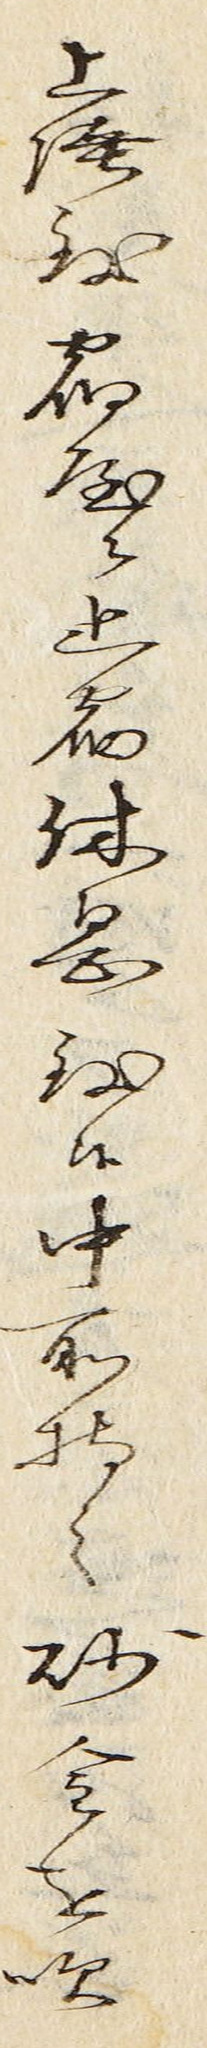上陸致宿屋に止宿休息致候中所持之砂金を吹
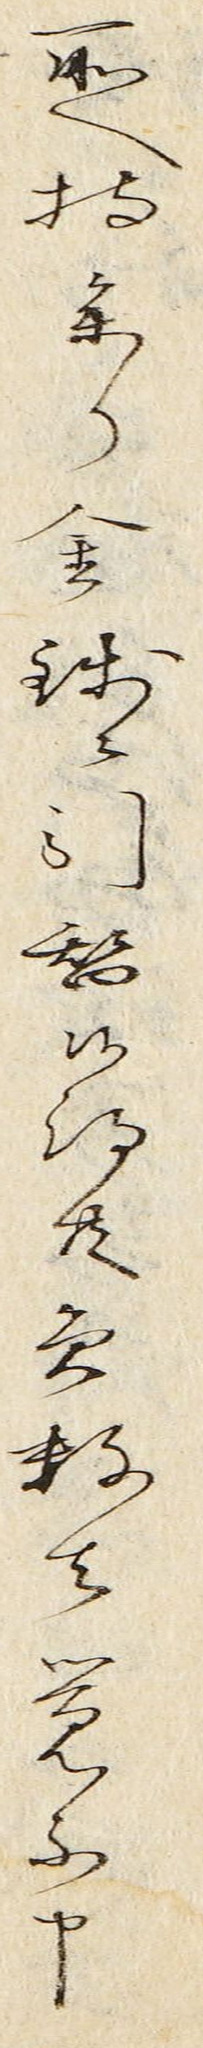所へ持参り金銭に引替候得共員数は覚不申
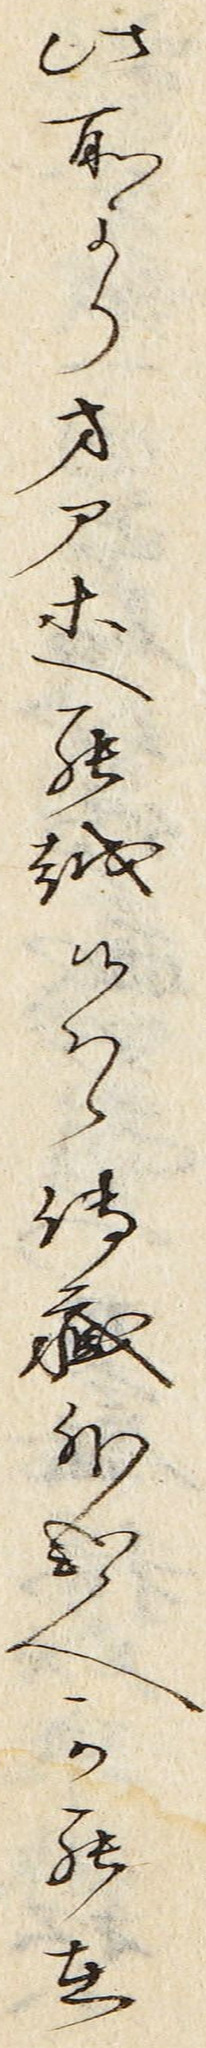此所よりオアホへ罷越候はゝ伝蔵外弐人可罷在
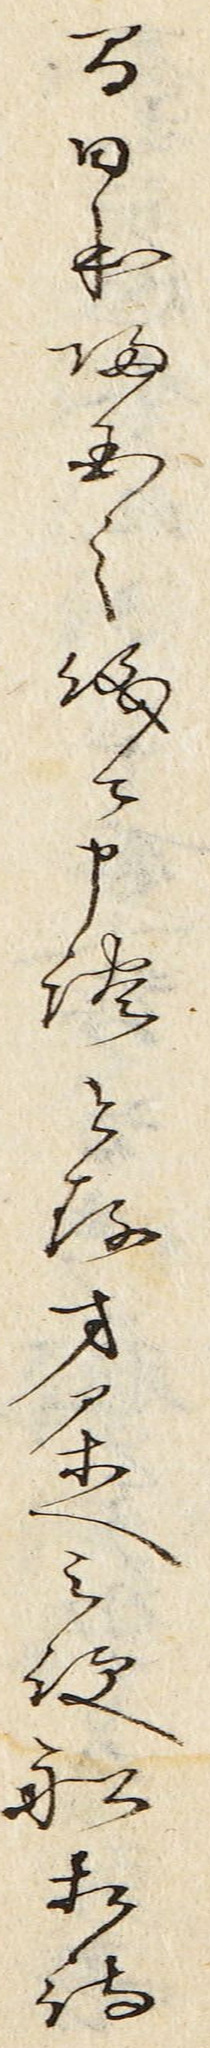間日本帰国之儀に申侭と存オアホへ之便船相待
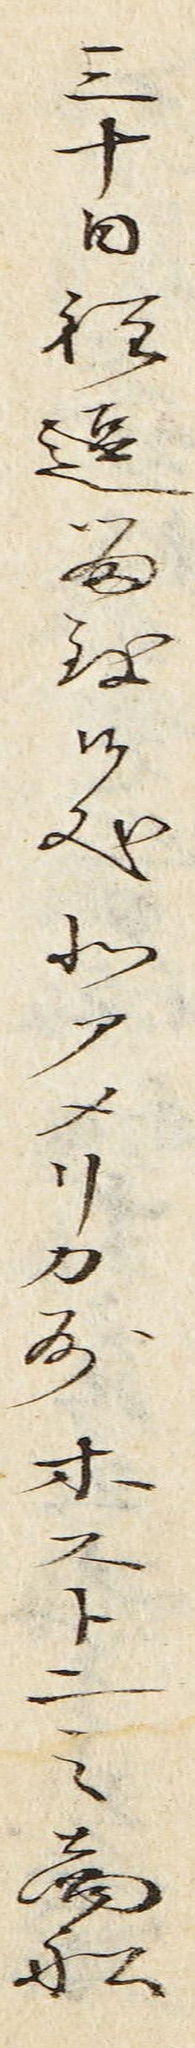三十日程逗留致候処北アメリカ州ホストン之商船
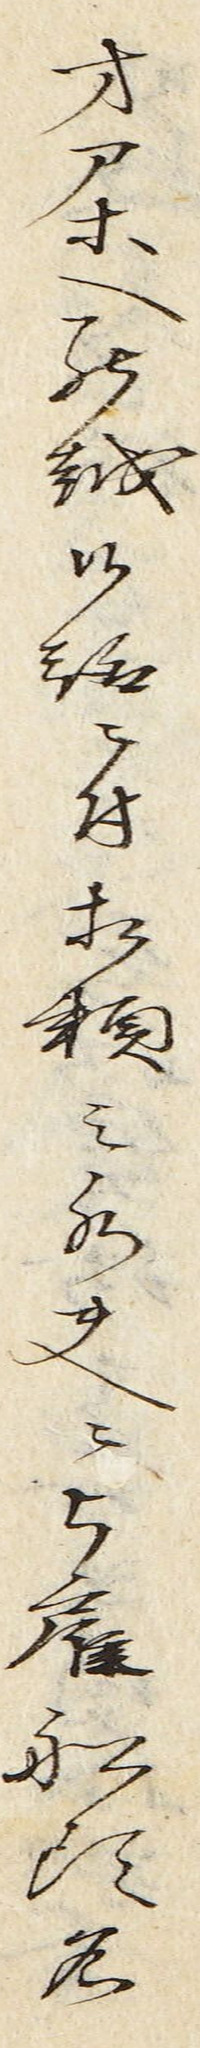オアホへ罷越候趣に付相頼み水夫に被雇船頭名
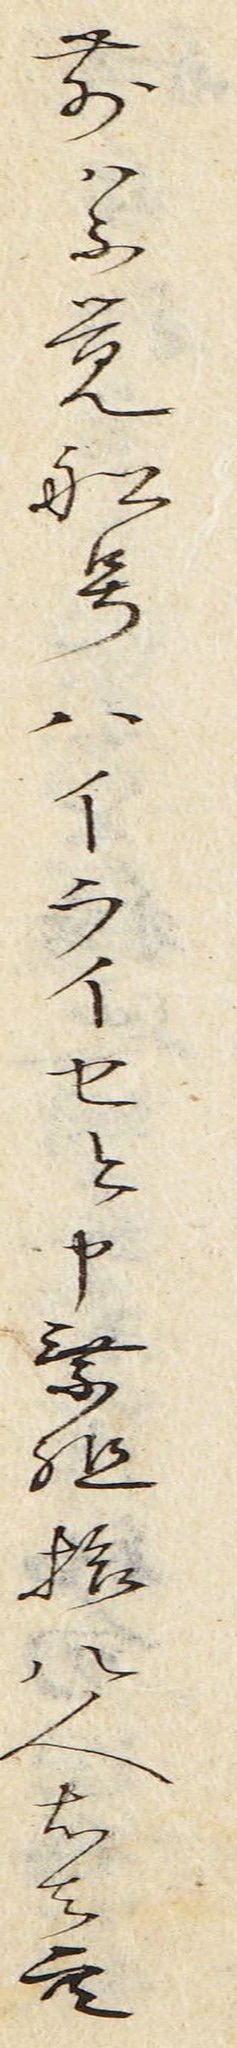前は不覚船号ハイライセと申乗組拾八人右は空

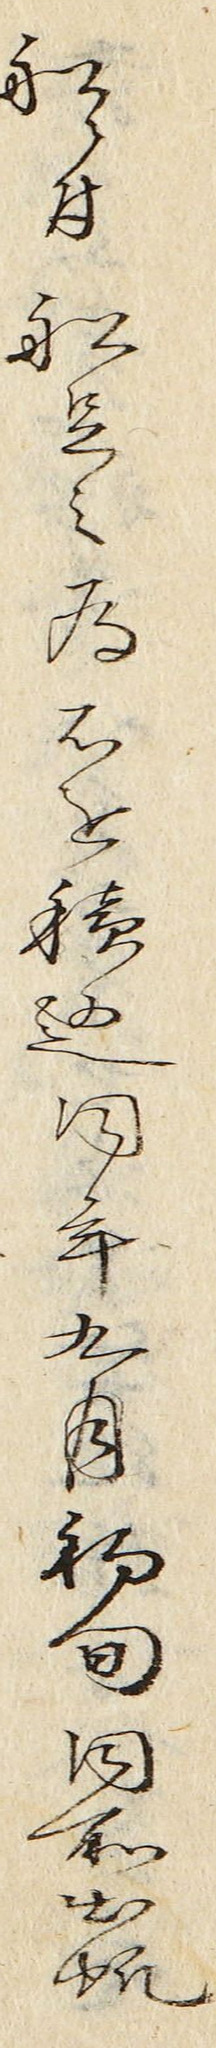船に付船足之為石を積込同年九月初旬同所出帆
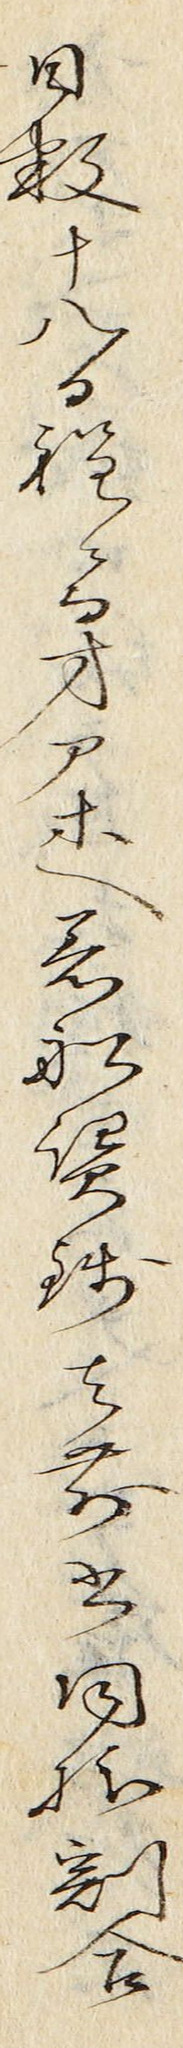日数十八日程に而オアホへ着船賃銭は前書同様割合
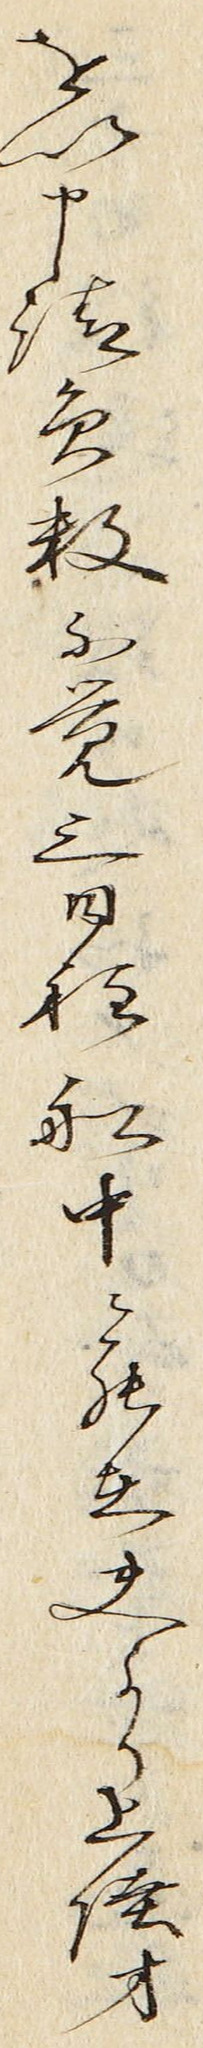を以申請員数不覚三日程船中に罷在夫より上陸オ
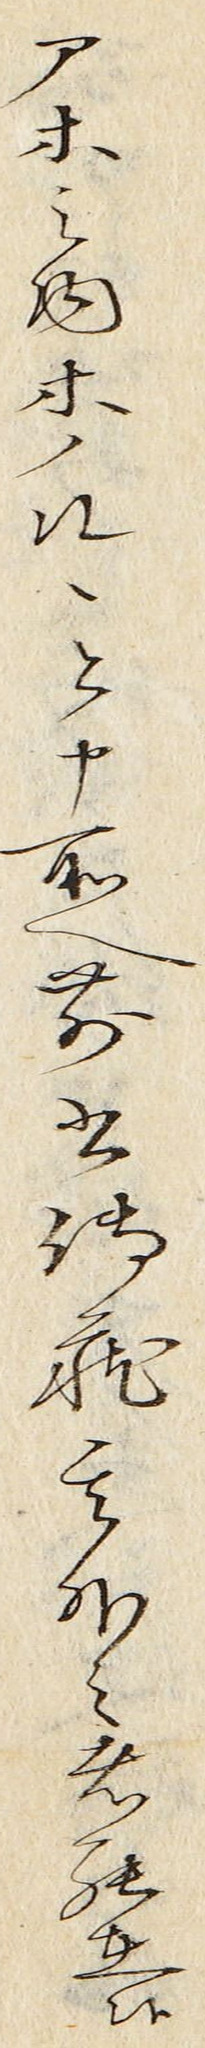アホ之内ホノルヽと申所へ前書伝蔵其外之罷在候
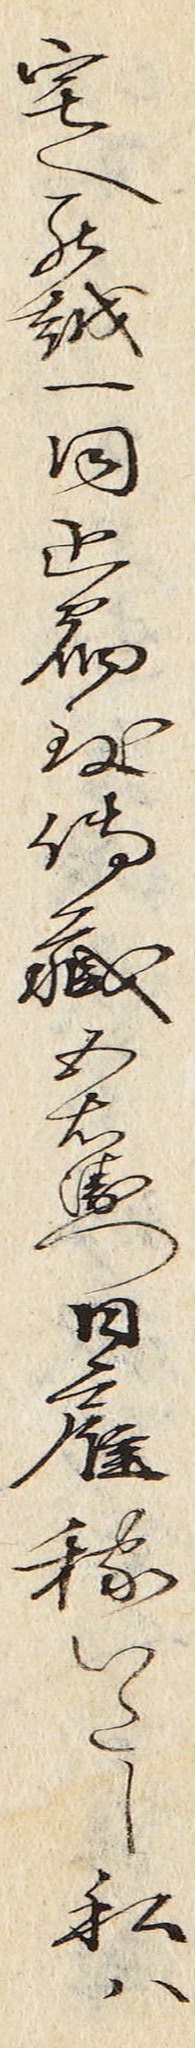宅へ罷越一同止宿致伝蔵五右衛門日雇稼いたし私は
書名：土佐中浜万次郎漂流記
